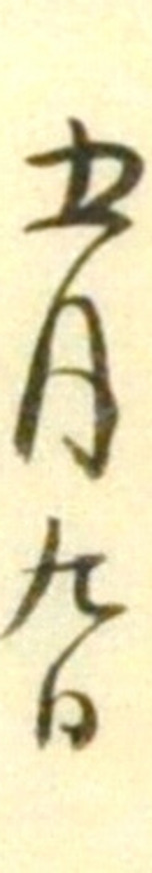五月九日
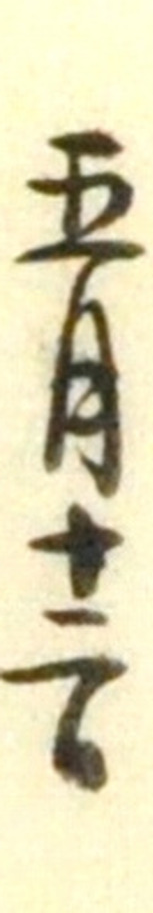五月十二日
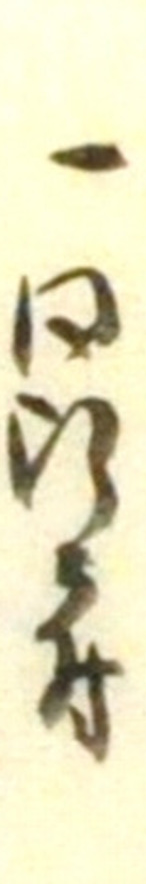一同断に付
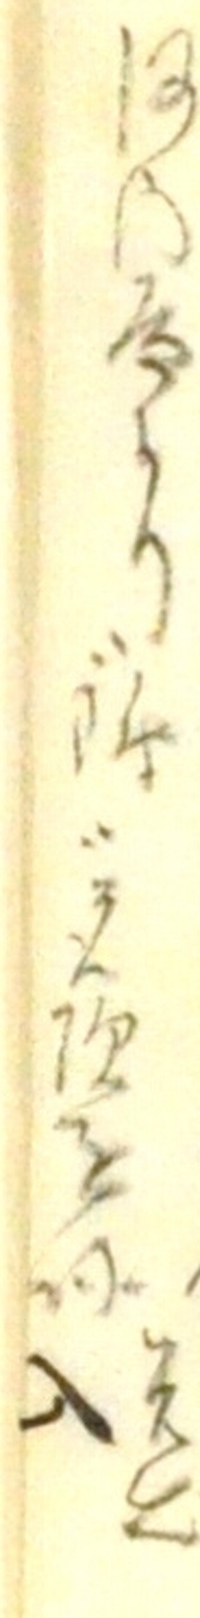河内殿より御附御取次を以入
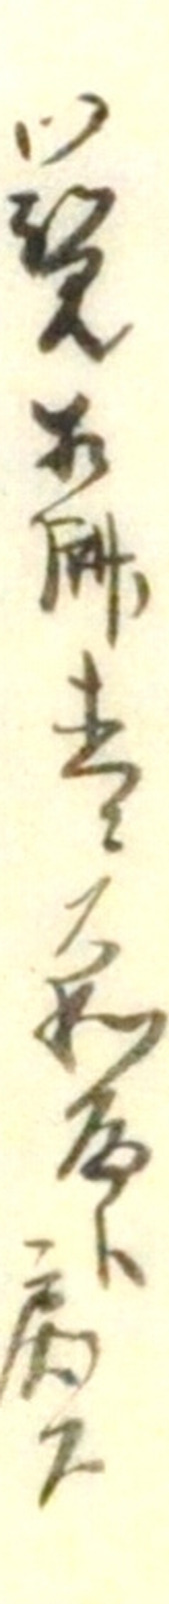御覧相済直に大和殿え戻ス
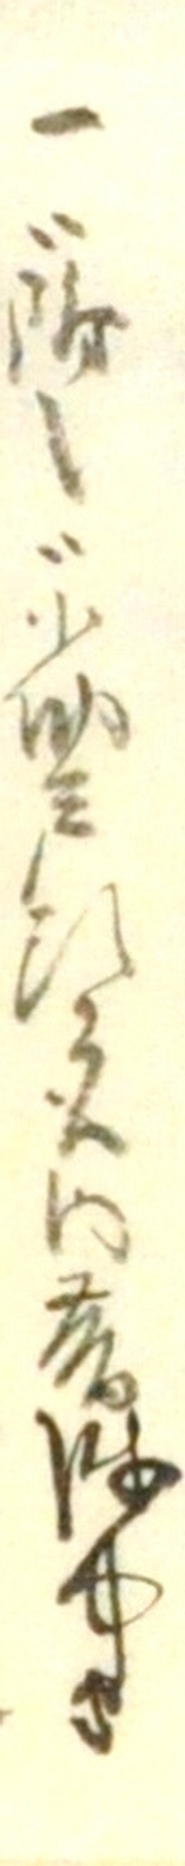一御附之御小納戸頭には内藤越中守
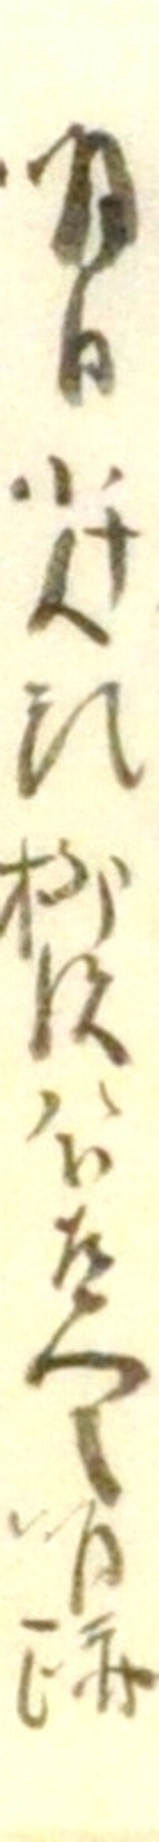明日小十人頭柳沢八郎左衛門之明跡
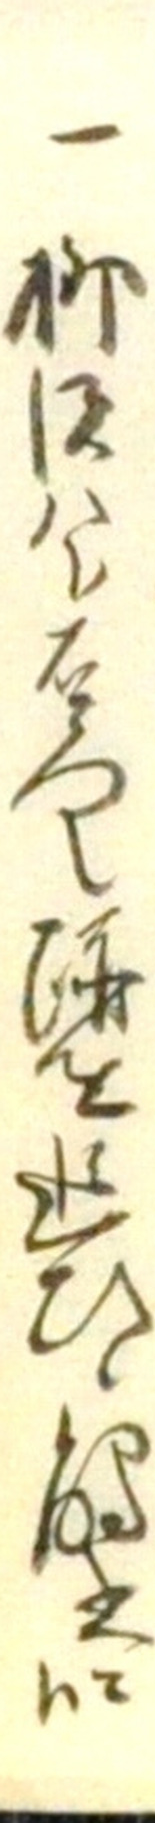一柳沢八郎左衛門之跡を追ひ候触書に候
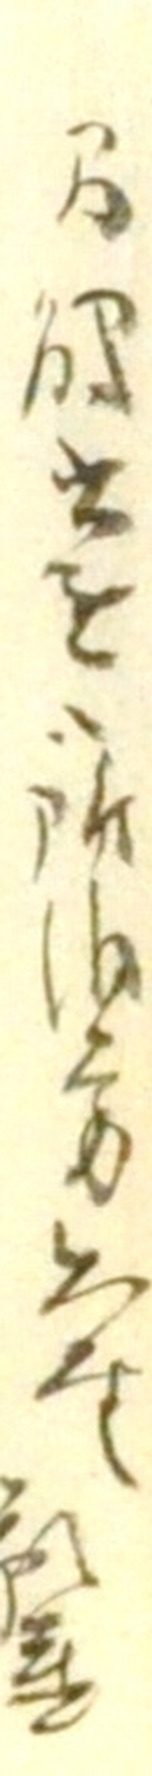間触書を御附伯方出座へ預置
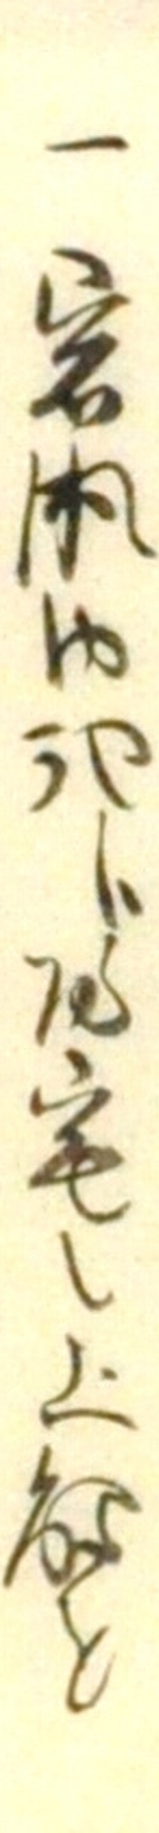一岩瀬内記え帰宅之上触を
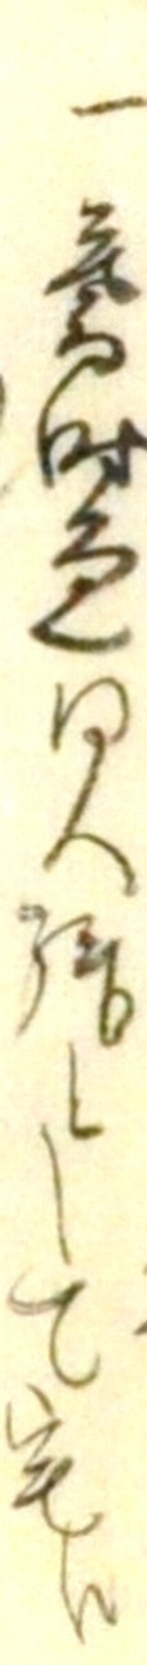一暮時過同人請として宅え

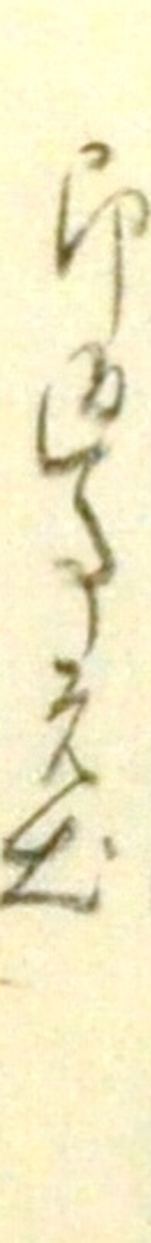即返事差出
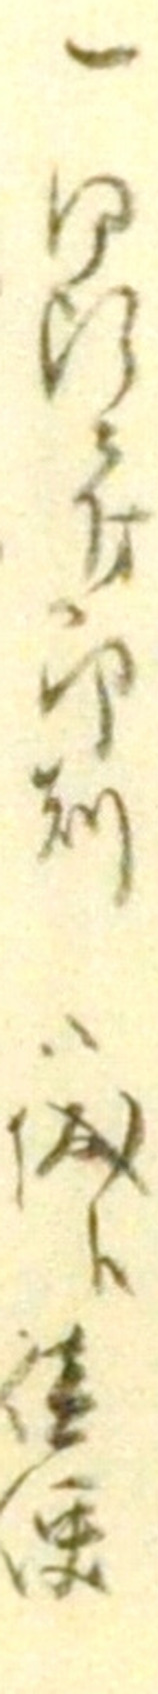一同断に付即刻御城え徒使
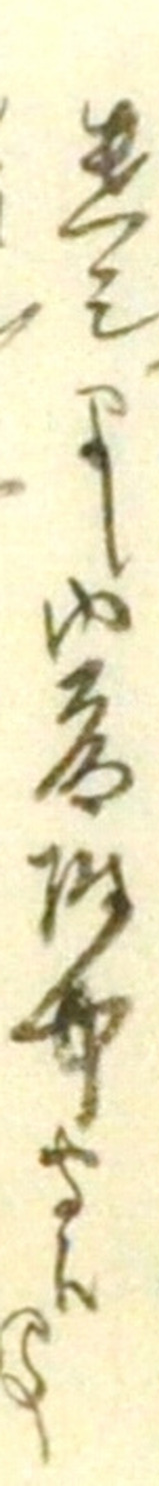遣シ早々内藤越中守え触
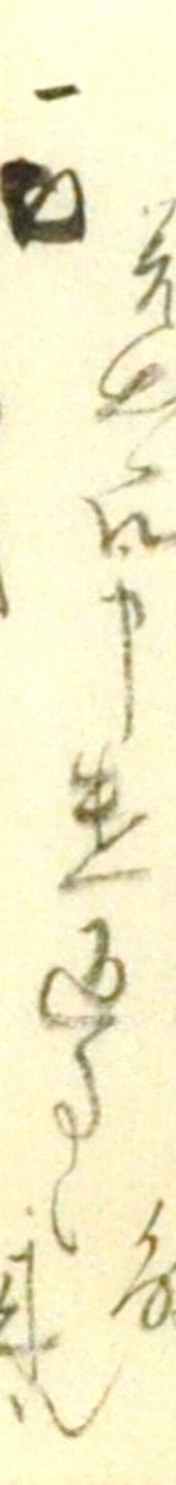差出候様申遣返事も来ル
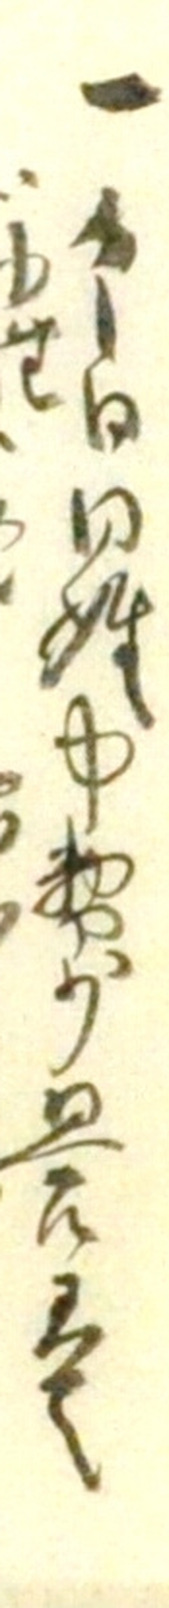一今日同姓中務少思召有之
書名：万覚
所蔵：伊那市立高遠町図書館・合同会社AMANE
